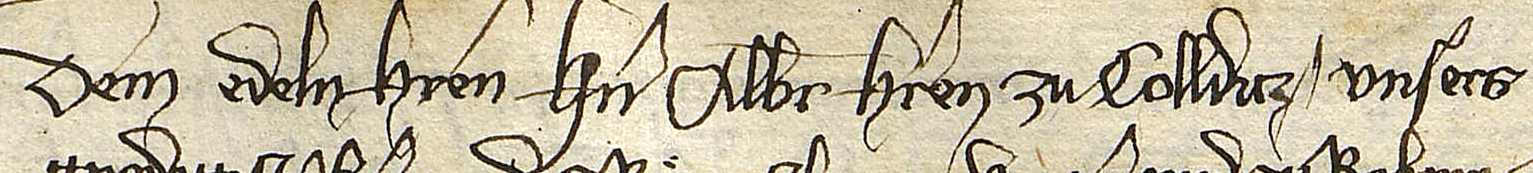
Dem edeln h*ren H*n Albr* h*ren ʒu Colldicʒ / vnſers
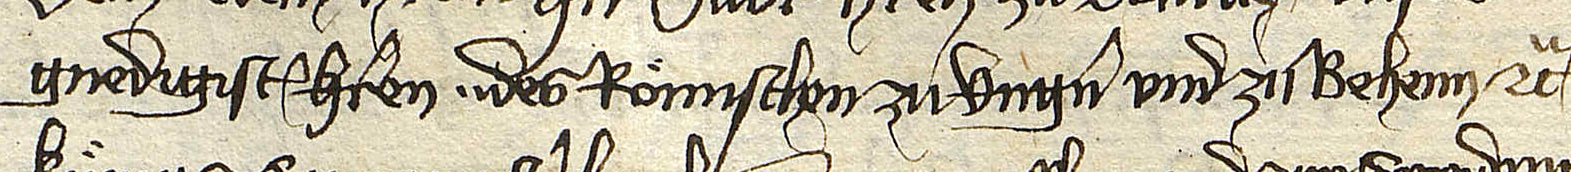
gnedigiſt* h*ren ~ des Römiſchen ʒu Vng*n vnd ʒu Beheim ec*
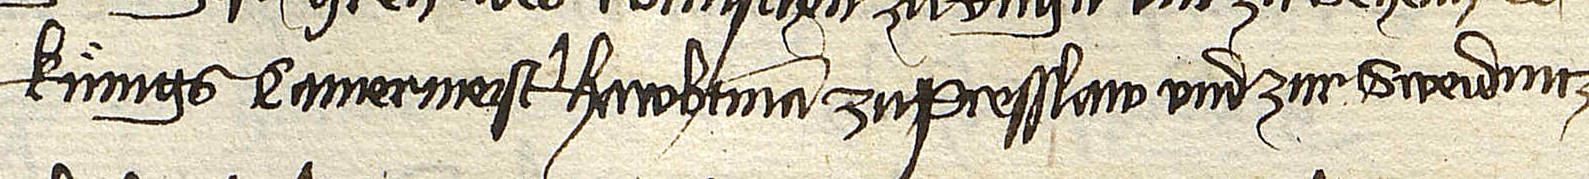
künigs Camermeiſt* hawbtma* ʒu Preſſlaw vnd ʒur Sweidnicʒ
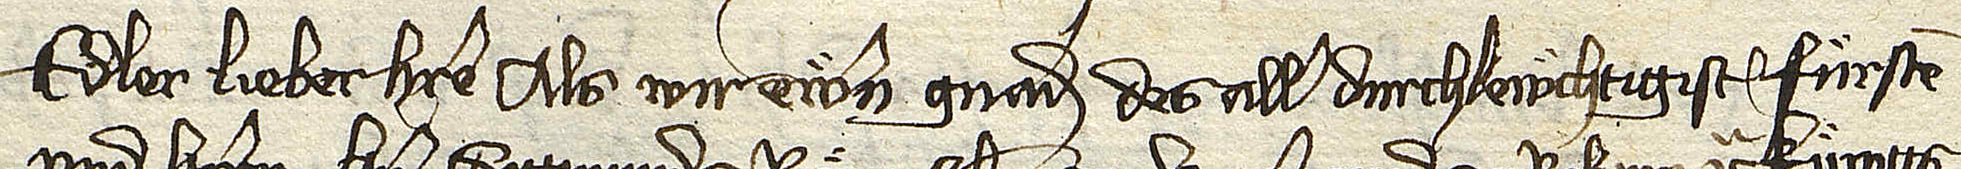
Edler lieber h*re Als wir ew*n gnad* des all* durchlewchtigiſt* fürſte*
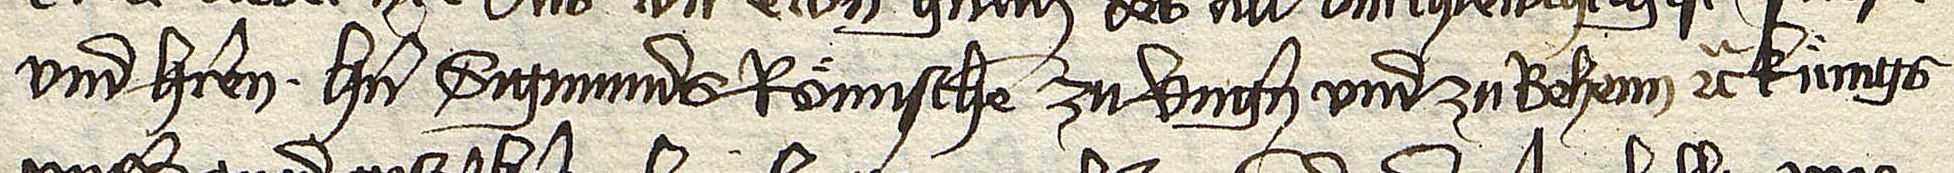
vnd h*ren . H*n Sigmunds Römiſche* ʒu Vng*n vnd ʒu Beheim ec* künigs
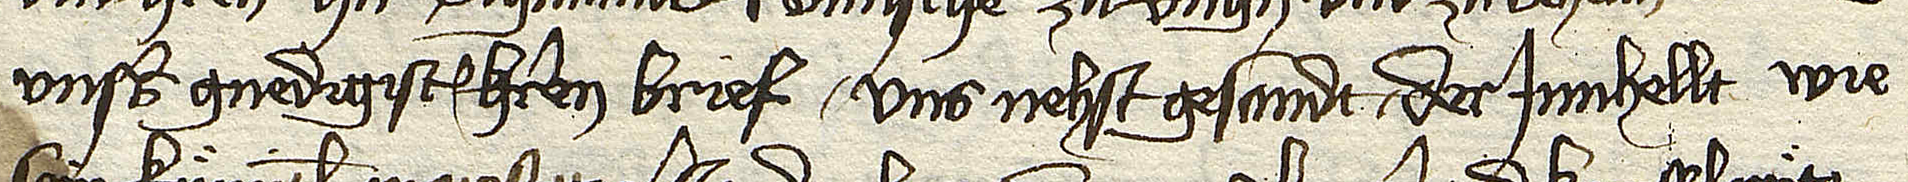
vnſ*s gnedigiſt* h*ren brief / vns nehſt geſandt / der Innhellt wie
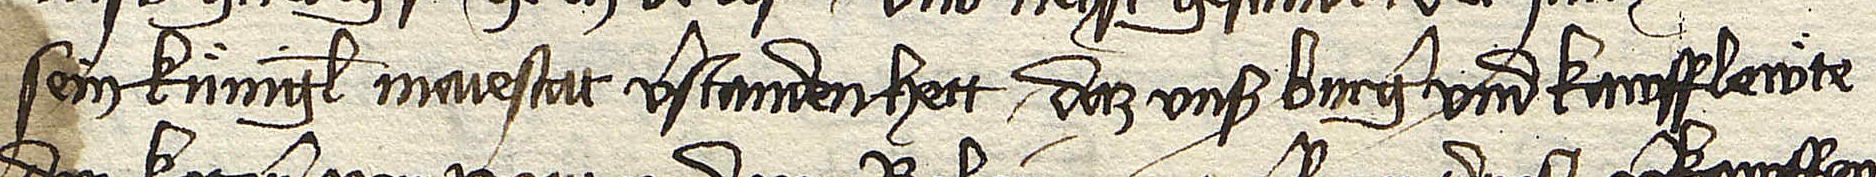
ſein künigl* maieſtat v*ſtanden hett / daʒ vnſ* burg* vnd kawfflewte
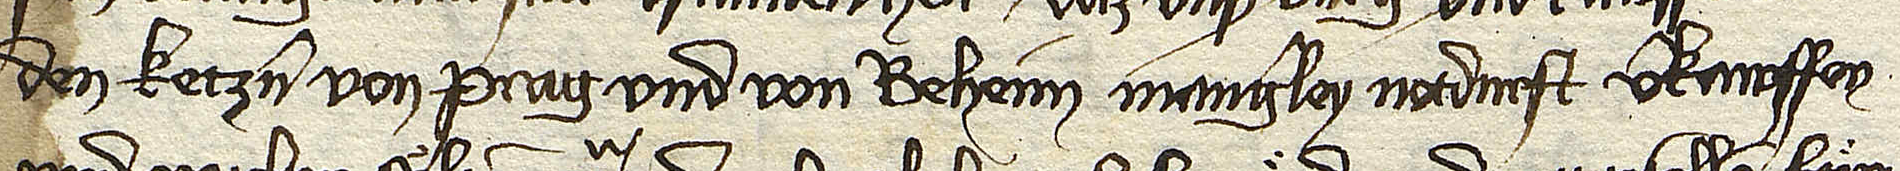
den kecʒ*n von Prag vnd von Beheim mang*ley notdurft v*kawffen
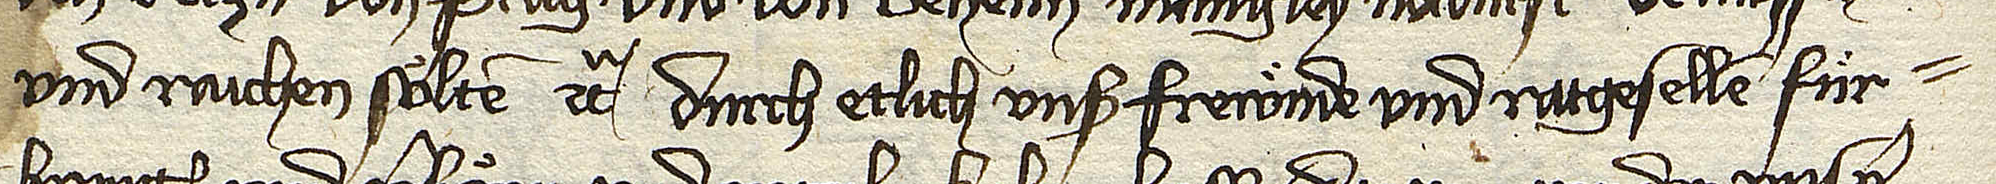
vnd raichen ſölte* ec* durch etlich vnſ* frewnde vnd ratgeſelle* für =
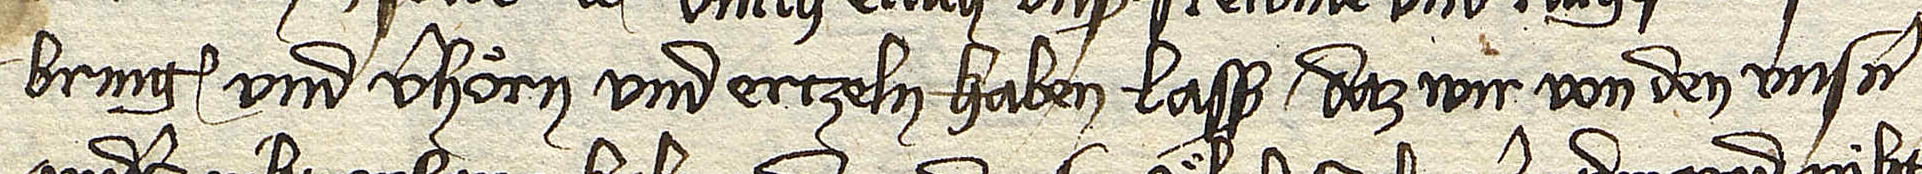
bring* vnd v*hörn vnd ercʒeln haben laſſ* / daʒ wir von den vnſ*n
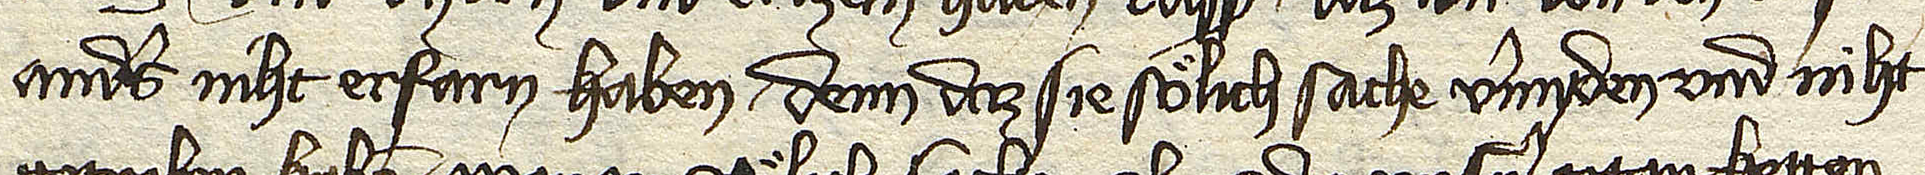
and*s niht erfarn haben / denn daʒ ſie ſölich ſache v*myden vnd niht
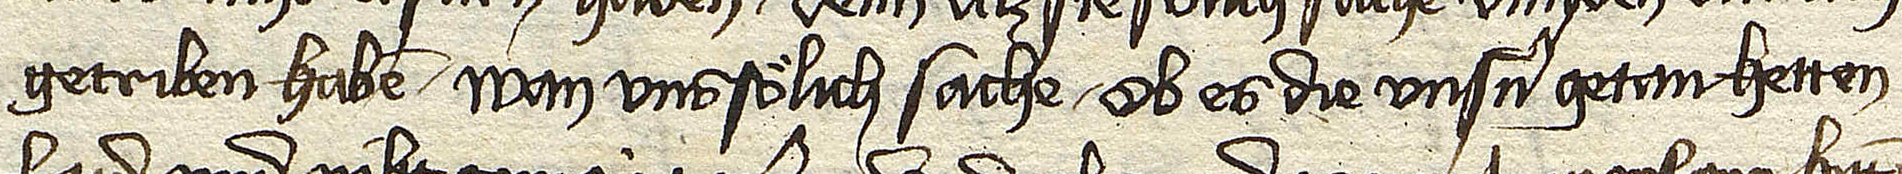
getriben habe* / wan vns ſölich ſache / Ob es die vnſ*n getan hetten
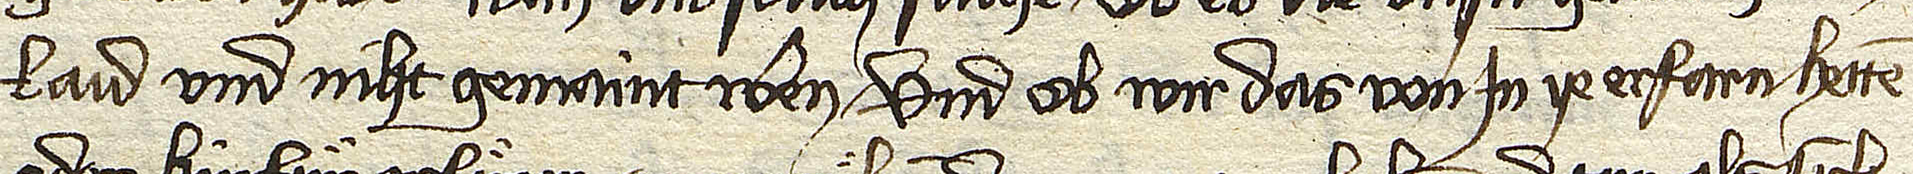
laid vnd niht gemaint we*n / Vnd Ob wir das von In ye erfarn hette*
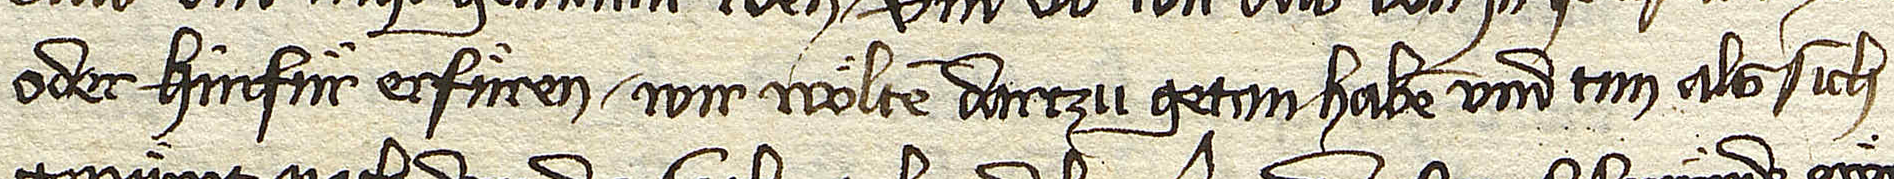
oder hinfür erfüren / wir wölte* darcʒu getan habe* vnd tun als ſich
